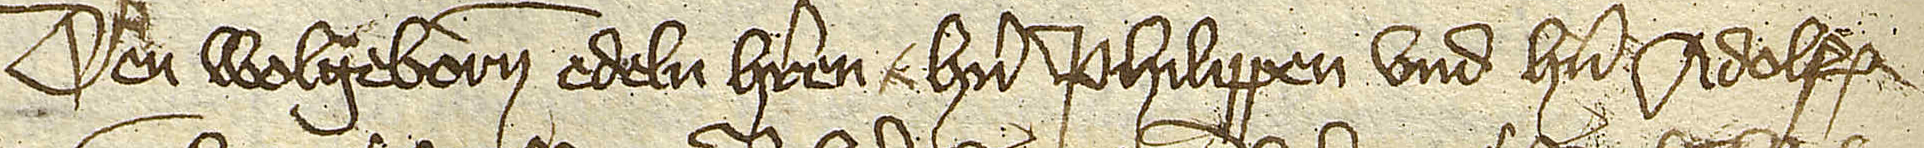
Den wolgeborn* edeln hr*en / hn* Philippen vnd hn* Adolf*
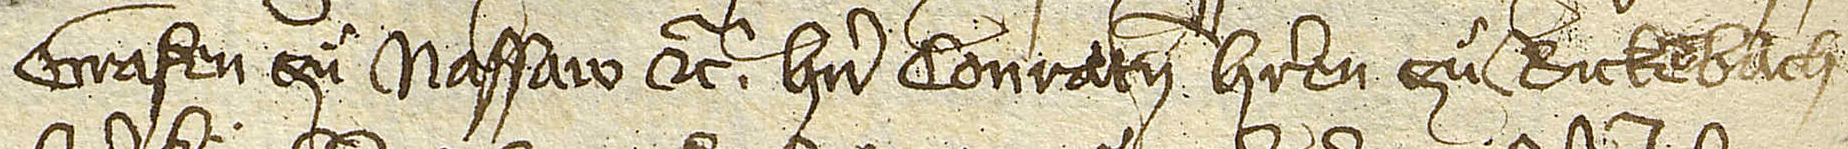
Grafen cʒü Naſſaw ec*. hn* Conratn* hr*en cʒü Bickebach
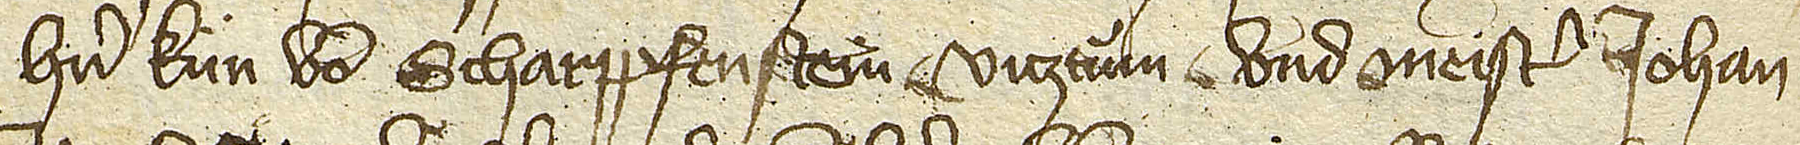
hn* kün vo* Scharppfenſtein vicʒtüm / vnd meiſt* Iohan
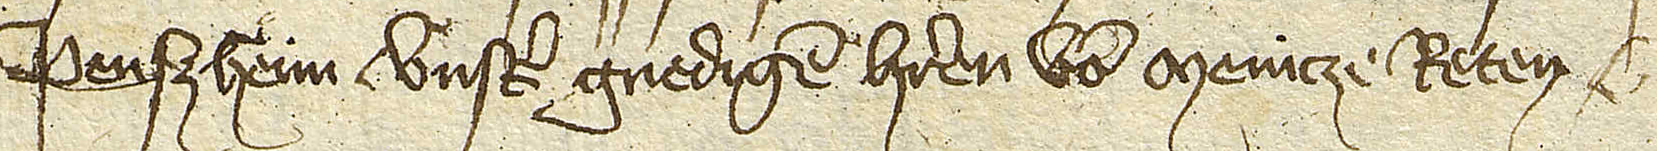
Penſʒheim / vnſs* gnedige* hr*en vo* Meincʒe Reten /
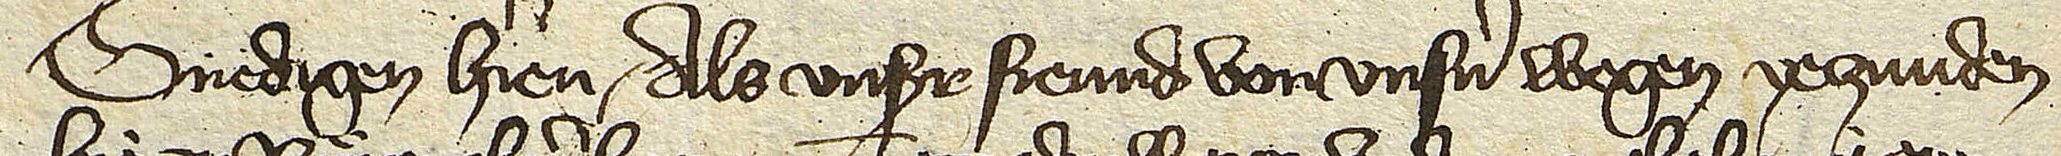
Gnedigen hr*en / Als vnſ*r freund von vnſn* wegen yecʒunden
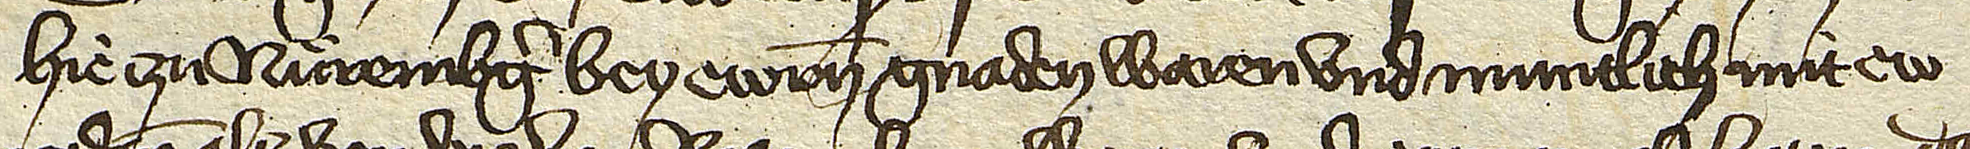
hie cʒu Nüremb*g bey ewrn* gnaden waren vnd muntlich mit ew
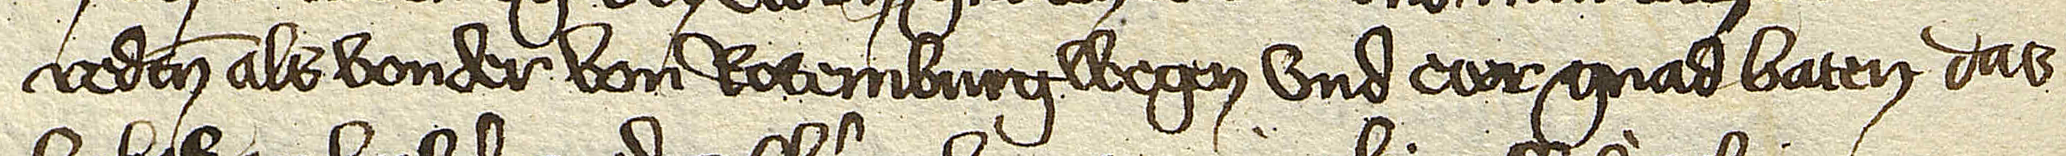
redtn* als von der von Rotemburg wegen vnd ewr gnad baten das
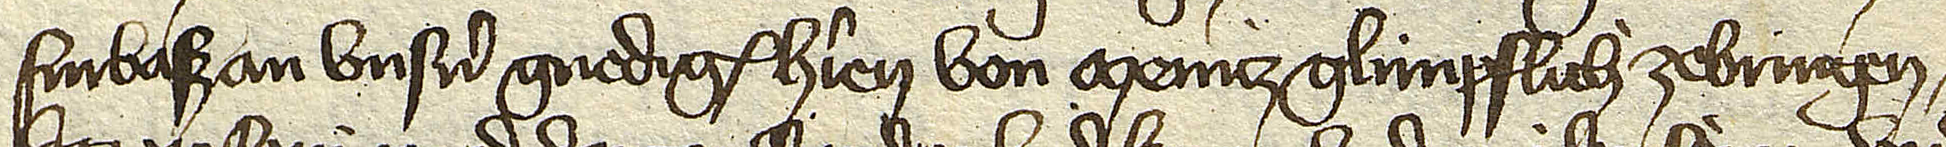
furbaſʒ an vnſn* gnedig* hr*en von Meincʒ glimpfflich cʒebringen /
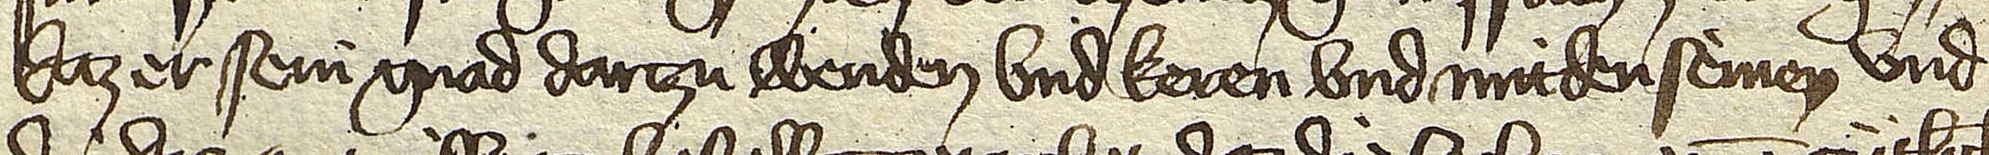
daʒ er ſein gnad darcʒu wenden vnd keren vnd mit den ſeinen vnd
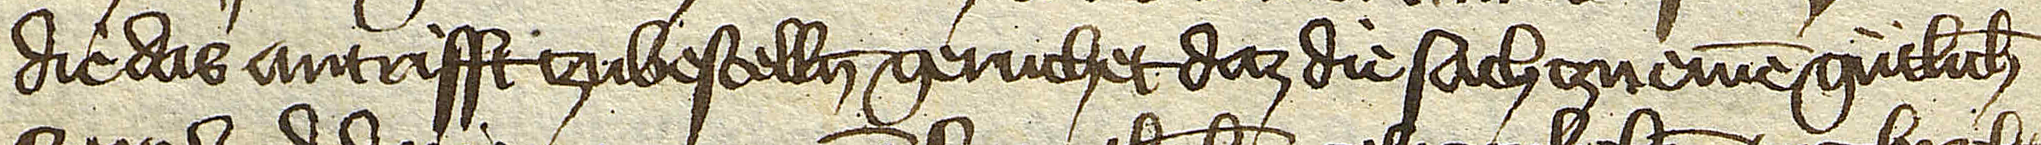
die das antrifft cʒubeſtelln* geruchet daʒ die ſach cʒu eine* gütlich*
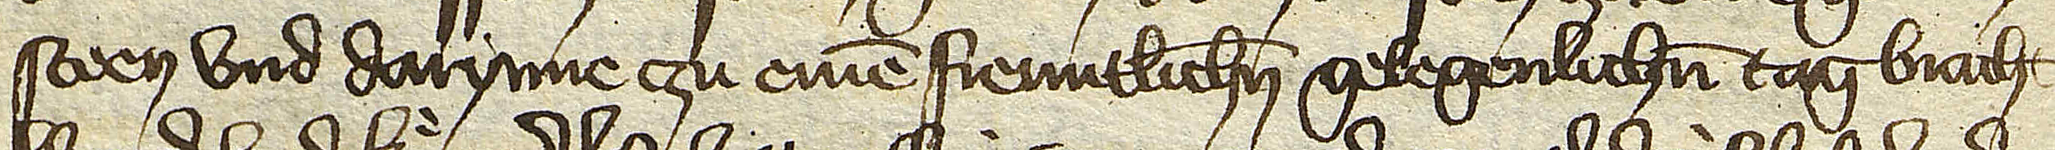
ſteen vnd darynne cʒu eine* freuntlichn* gelegenlichn* tag bracht
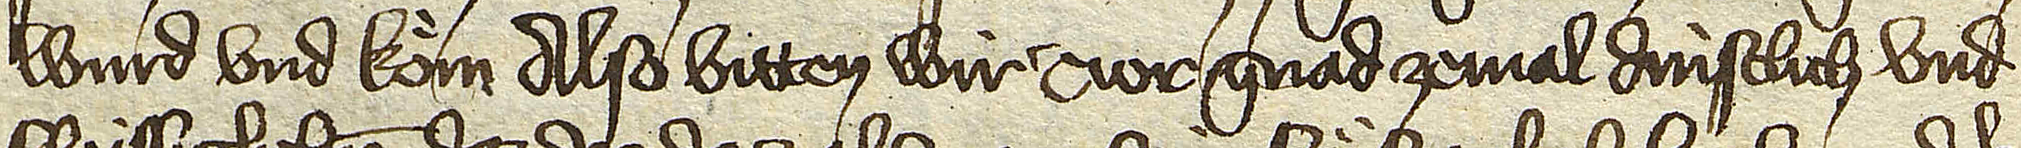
wurd vnd köm Alſo bitten wir ewr gnad cʒemal dinſtlich vnd
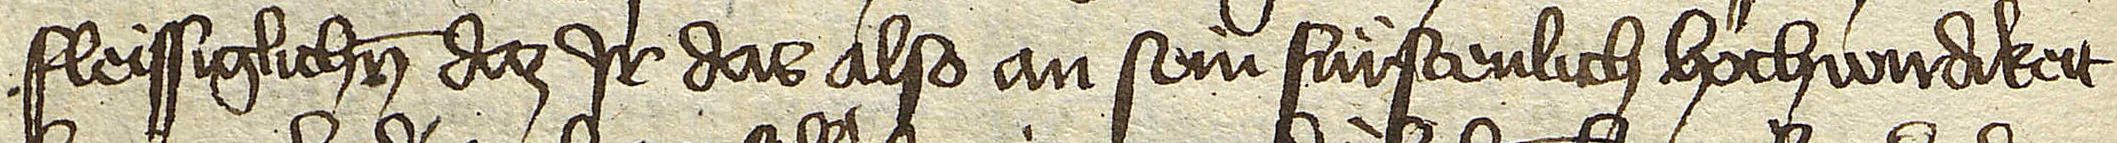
fleiſſiglichn* daʒ Ir das alſo an ſein fürſtenlich hochwirdikeit
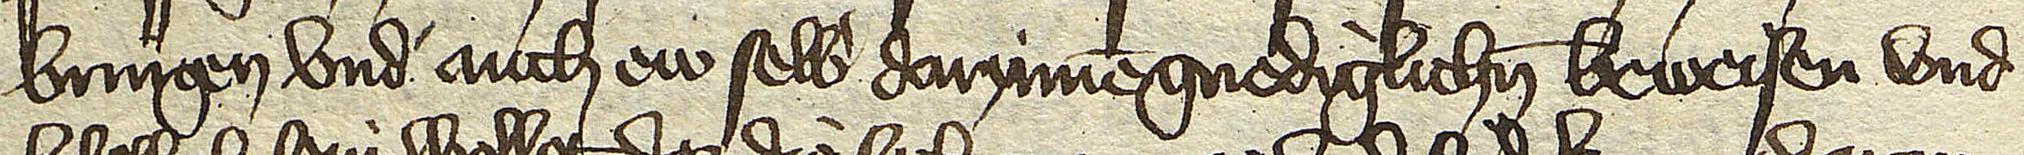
bringen vnd auch ew ſelb* darynne gnediglichn* beweiſen vnd
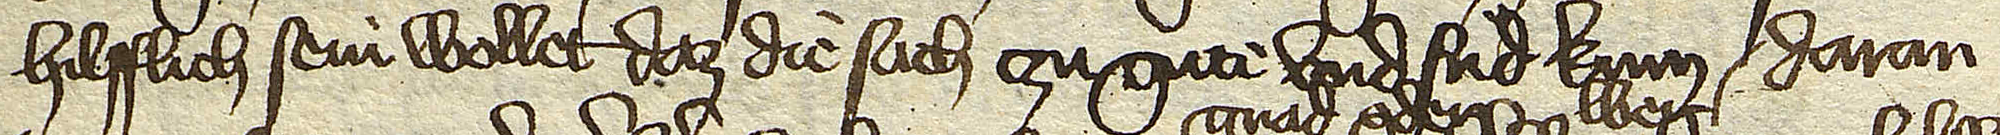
hilfflich ſein wollet daʒ die ſach cʒu gute vnd frid kum / daran
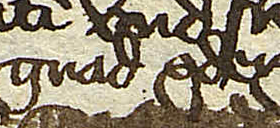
gnad oder
